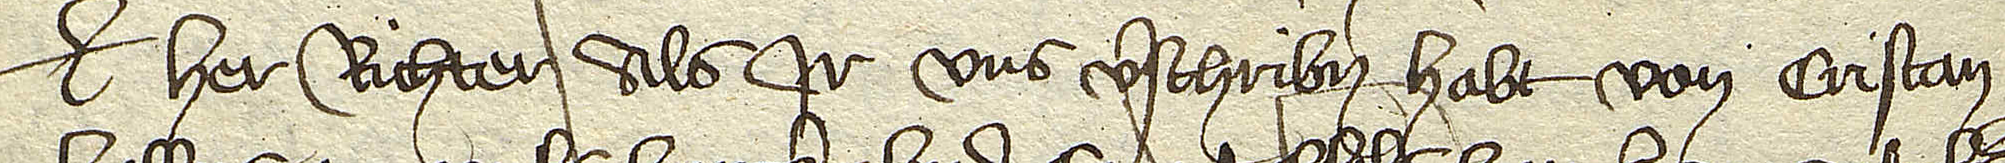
L* her Richter Als Ir vns v*ſchribn* habt von Criſtan
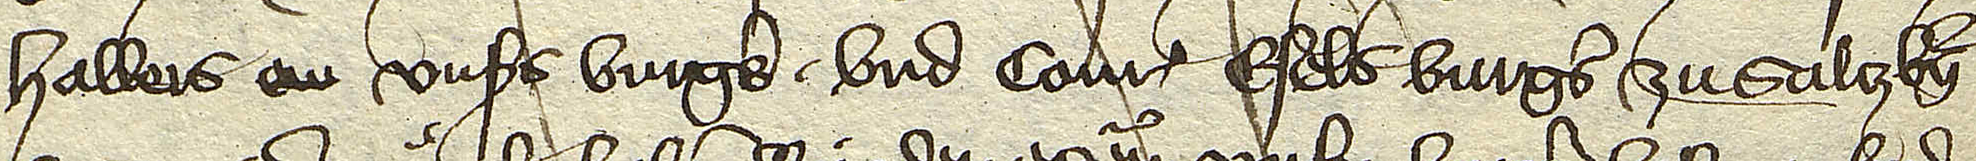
hallers ew vnſ*s burgs* / vnd Conr* Eſels burgs* cʒu Salcʒb*g
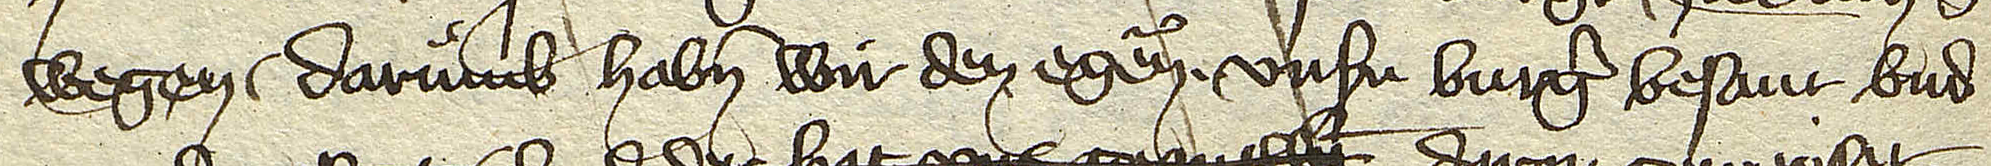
wegen / darümb habn* wir den egen* ~ vnſ*n burg* beſant vnd
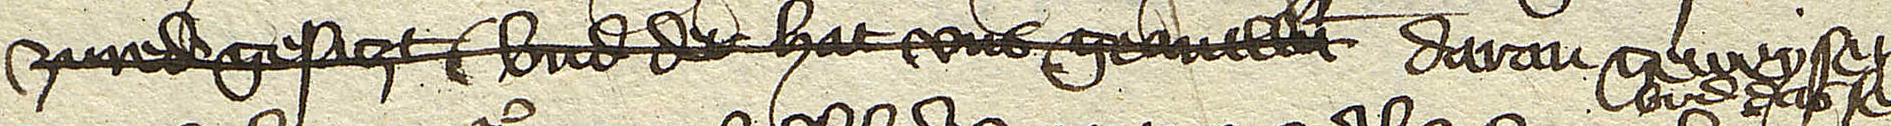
cʒurede geſacʒt / vnd der hat vns geantwt* daran geweyſet
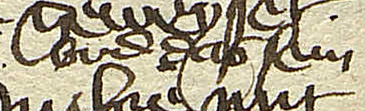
vnd das ſein
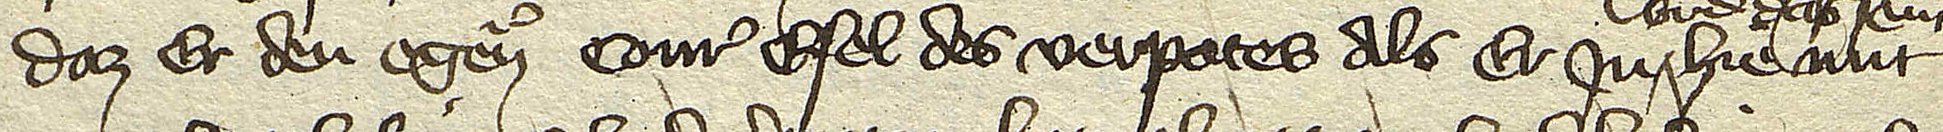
daʒ Er den egen* Conr* Eſel des verpotes Als Er In hie mit
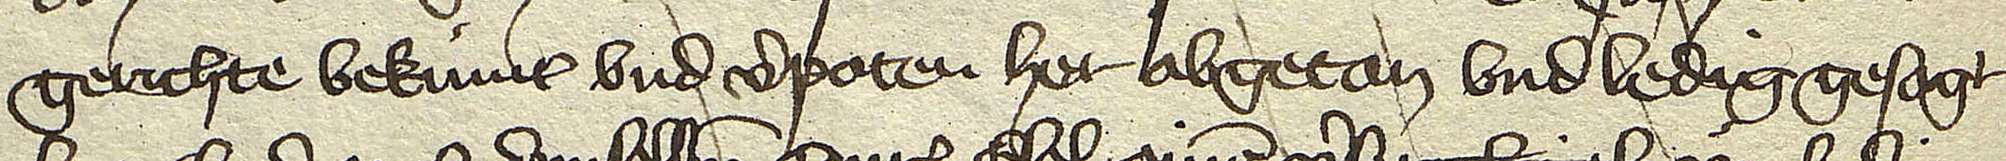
gerichte bekümt* vnd v*poten het abgetan vnd ledig geſagt
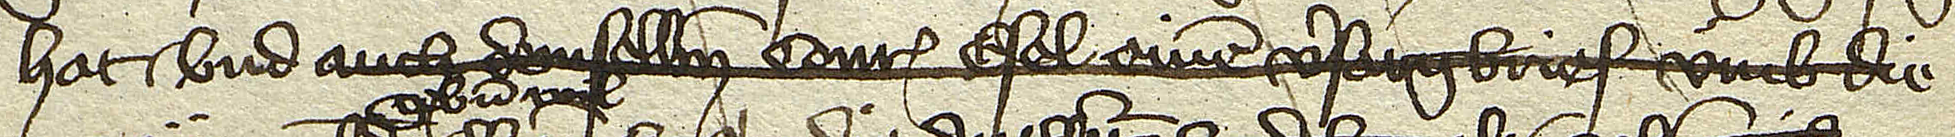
hat / vnd auch demſelbn* Conr* Eſel eine* v*ſorg brief vmb die
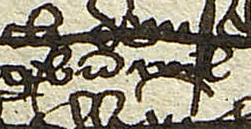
gebn* wil
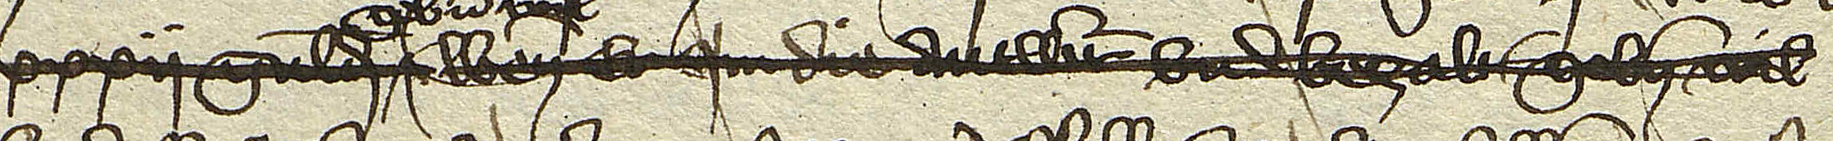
xxxii guld / wen Er Im die Antwt* vnd becʒalt / gebn* wil
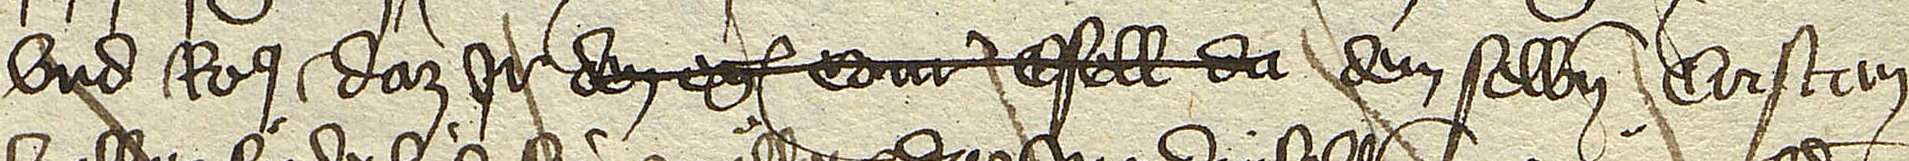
vnd Ro* / daʒ Ir den eg* Conr* Eſell da dem ſelbn* Criſtan
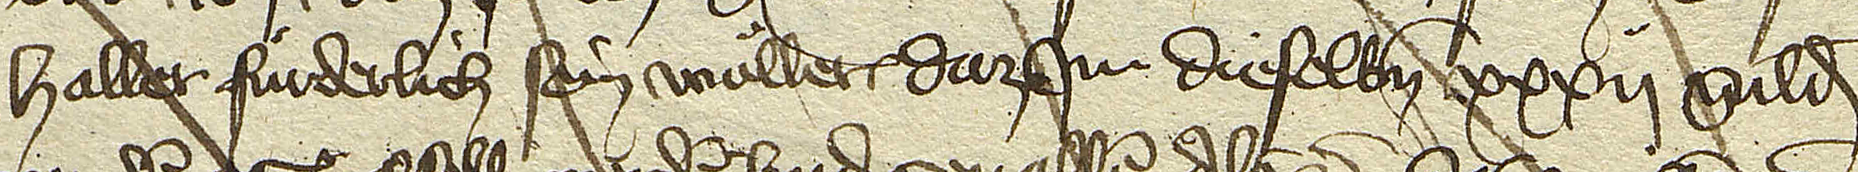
haller fürderlich ſein wöllet / daʒ Im dieſelbn* xxxii guld*
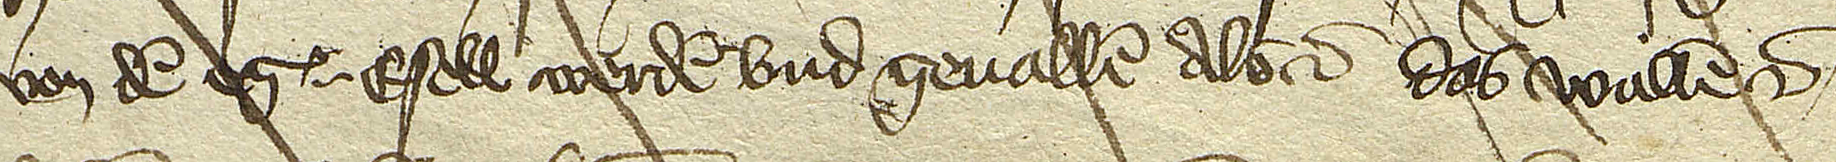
von d* eg* ~ Eſell werde* vnd geualle* Als ec* das wölle* ec*
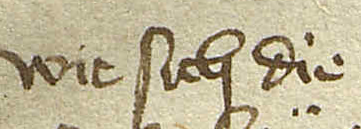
wie ſich die
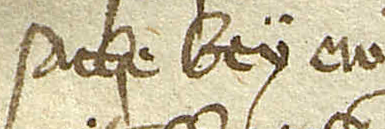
ſache bey ew
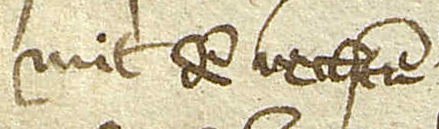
mit d* rechte*
